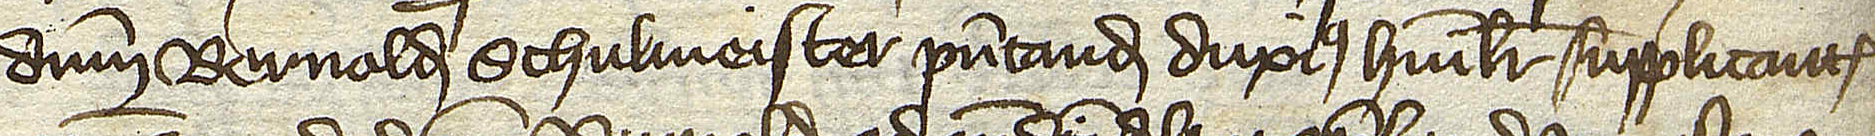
d*um Bernold* Schulmeiſter p*tand* duxi* hu*il*r ſupplicant*
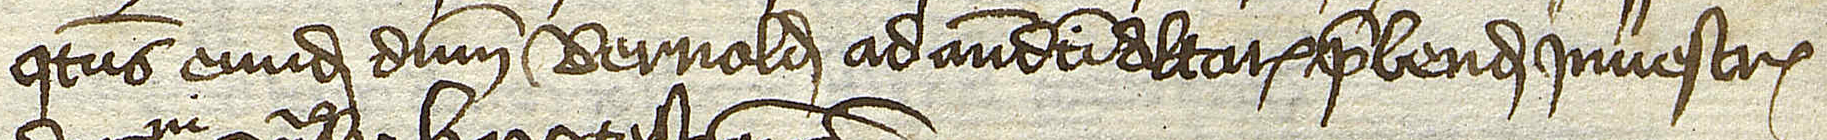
q*t*us eund* d*um Bernold* ad an*d*ti Altar* p*bend* Inueſtr*
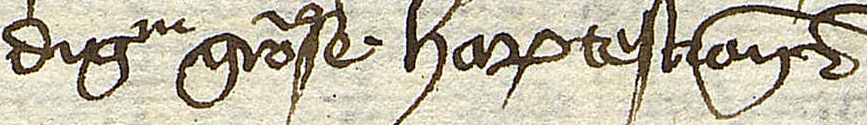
dig* g*roſe . Ha* teſtion* ec*
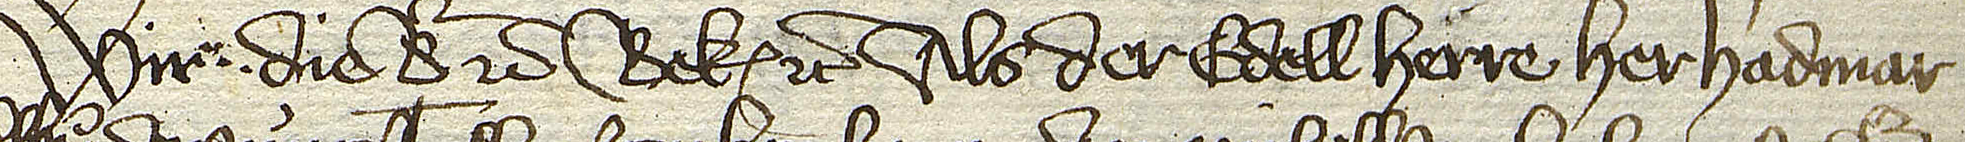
Wir ~ die B* ec* Bek* ec* Als der Edell herre her Hadmar
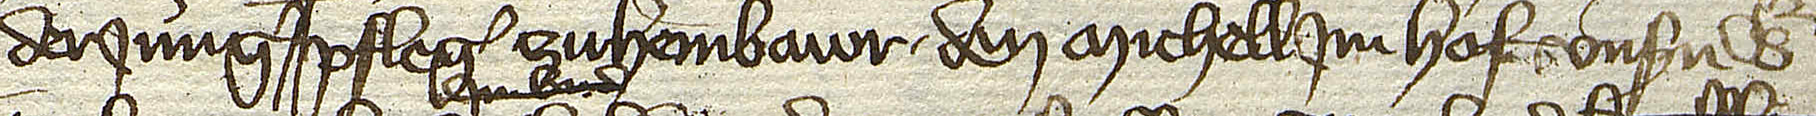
der Iüng* pfleg* cʒu hembawr / den Michell Im hof ~ vnſ*n B*
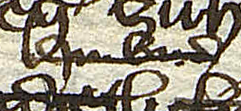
Im vnd
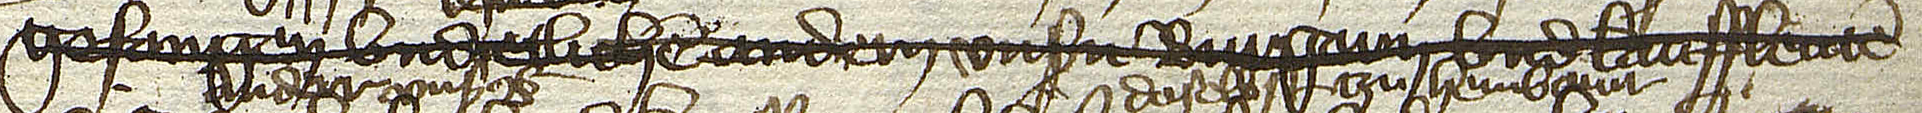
gefangen vnd etliche* andern vnſ*n Burgern vnd kauffleute*
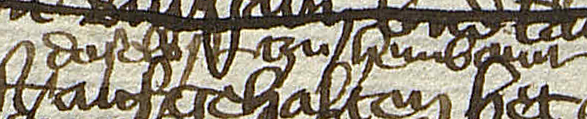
daſelbſt cʒu hembawr
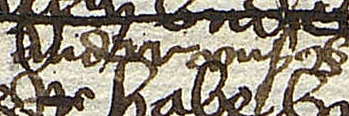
anderr vnſ* B*
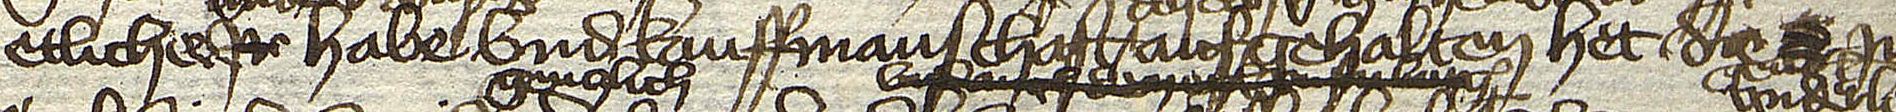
etliche* Ir habe vnd kauffmanſchaft angehalten het / die Er In
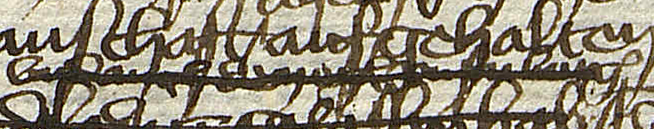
vnd an den eg* vnſ*n burg*
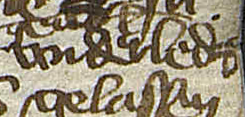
wider ledig
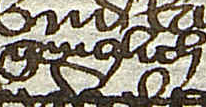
gencʒlich
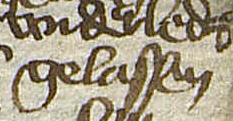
gelaſſen
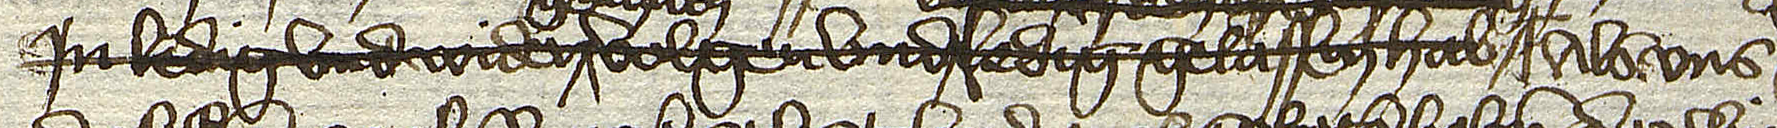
In ledig vnd wider volgen vnd ledig gelaſſen hab Als vns
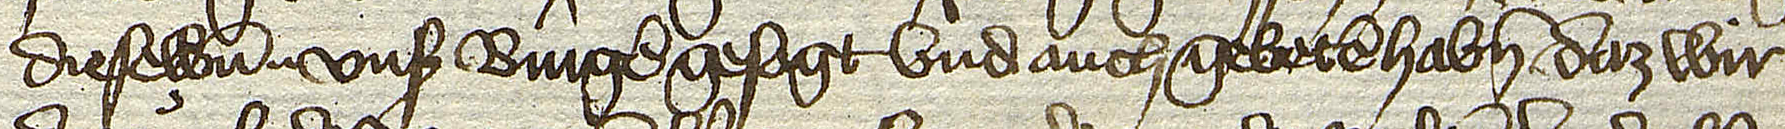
dieſelb*n ~ vnſ* Burge* geſagt vnd auch gebete* hab*n / daʒ wir
